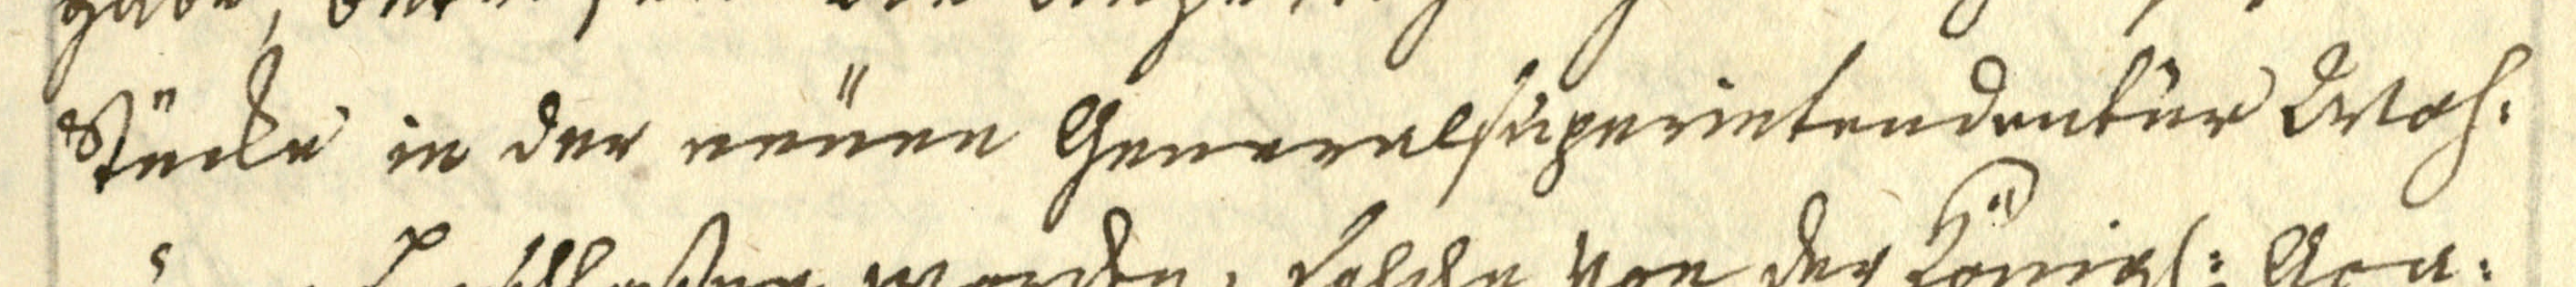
Stücke in der neuen Generalsuperintendenten Woh¬
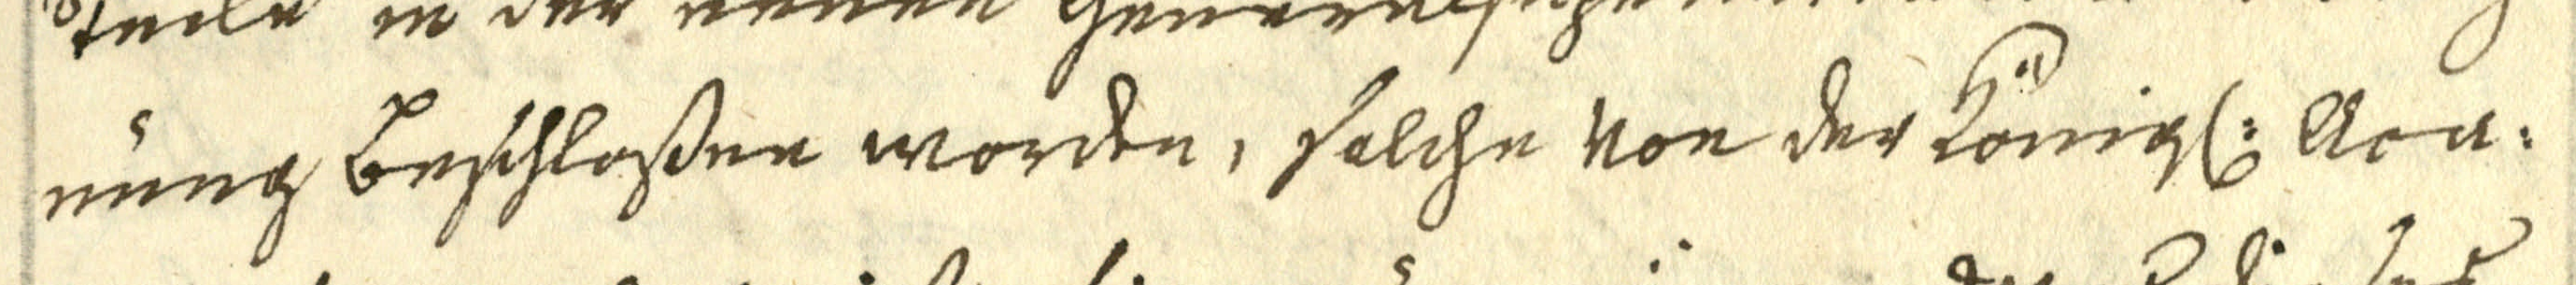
nung beschloßen worden, solche von der Königl. Aca¬
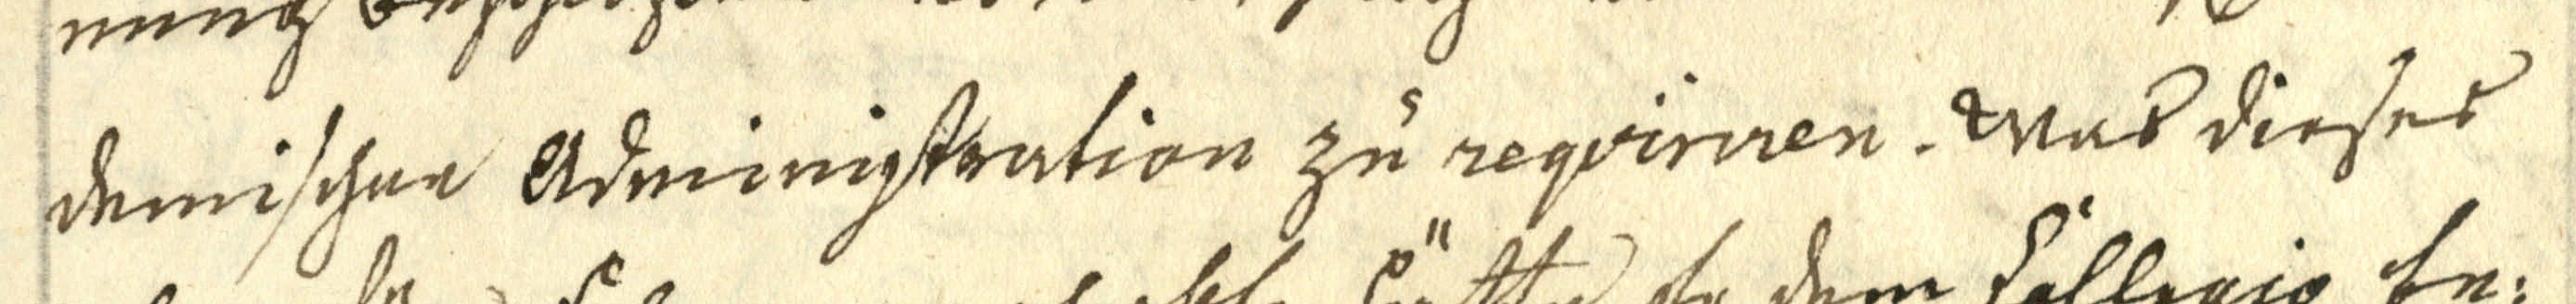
demischen Administration zu requiriren. Was dieses
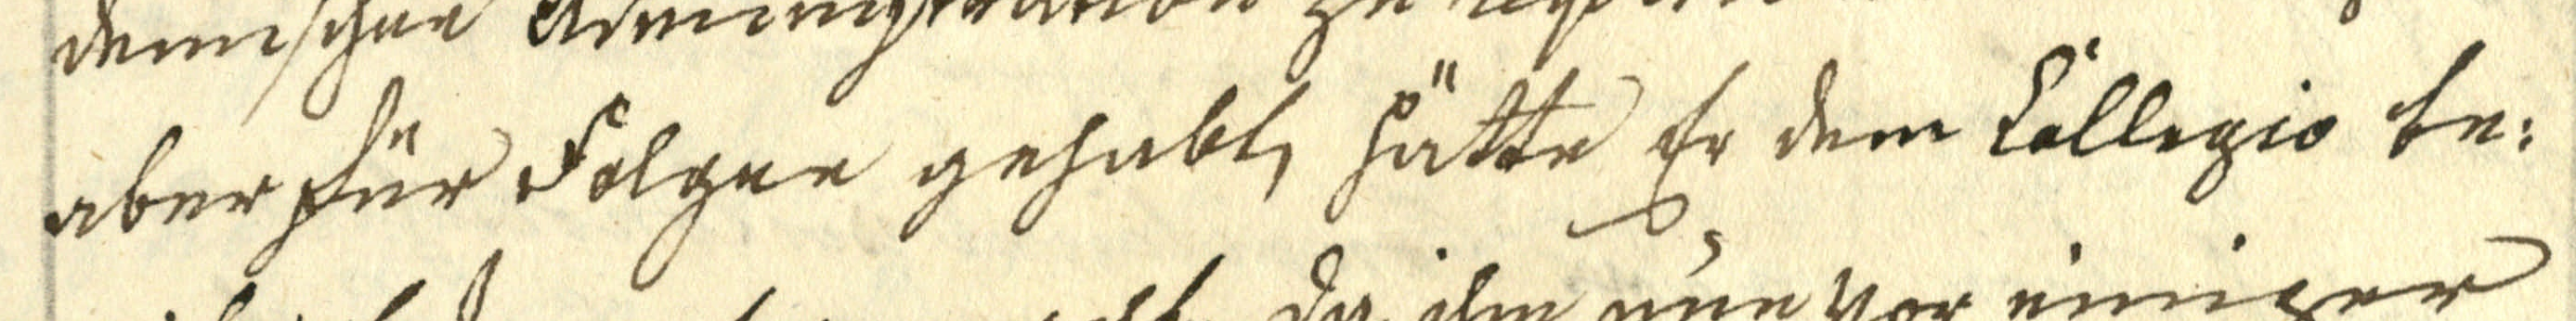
aber für Folgen gehabt, hätte Er dem Collegio be¬
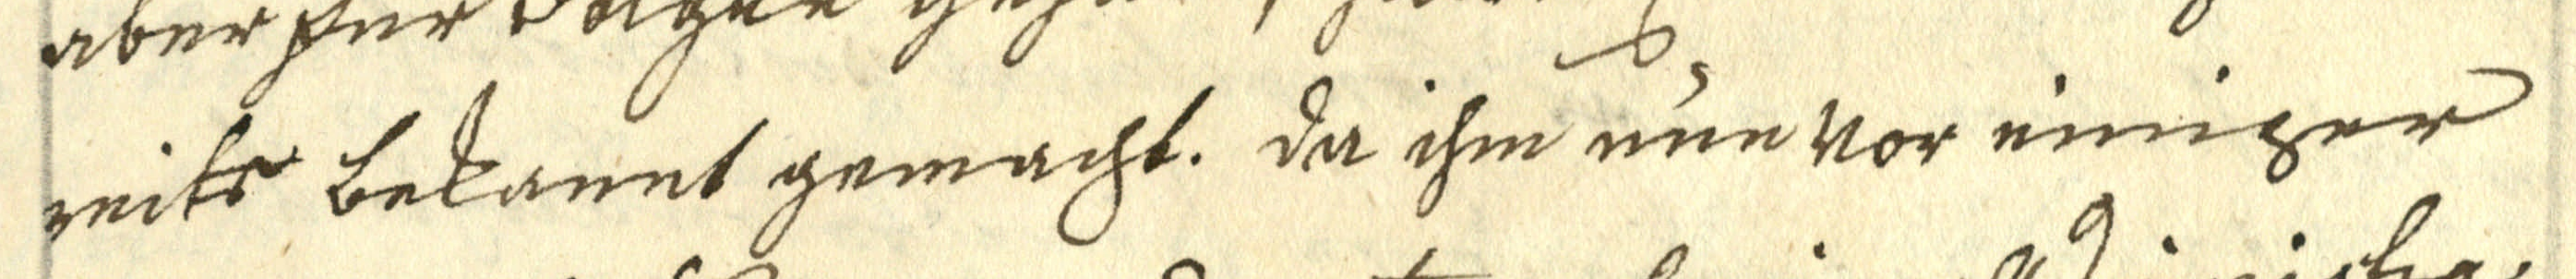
reits bekannt gemacht. Da ihm nun vor einiger
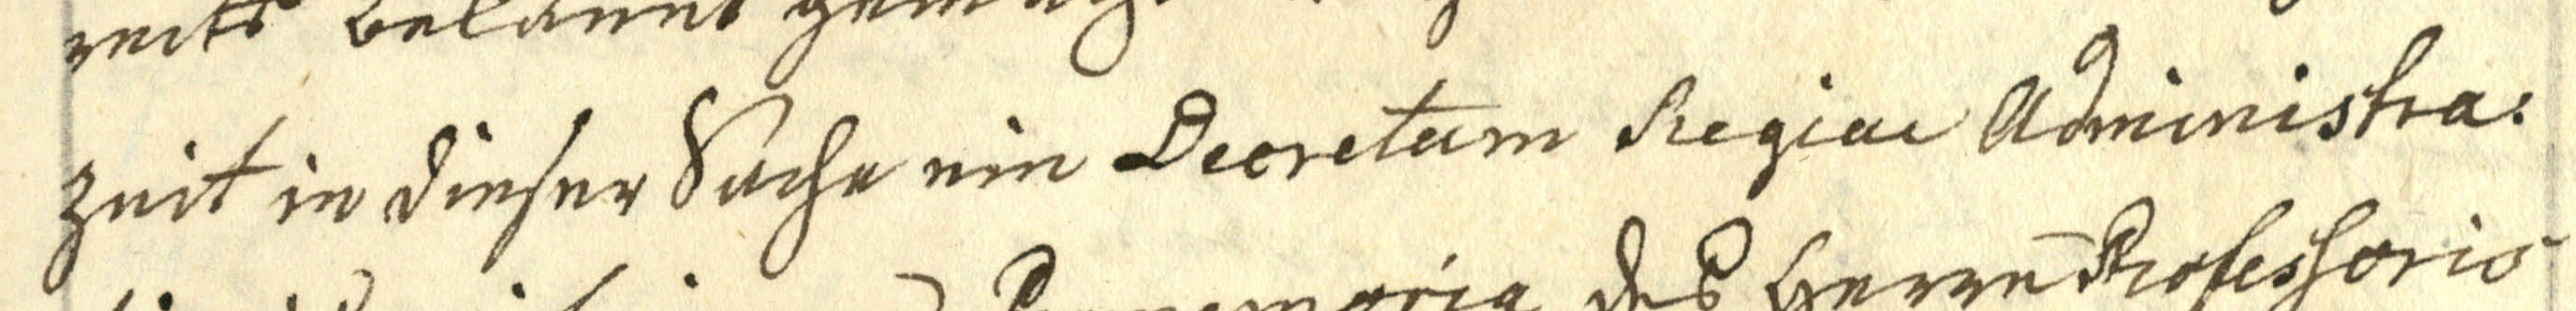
Zeit in dieser Sache ein Decretum Regiae Administra¬
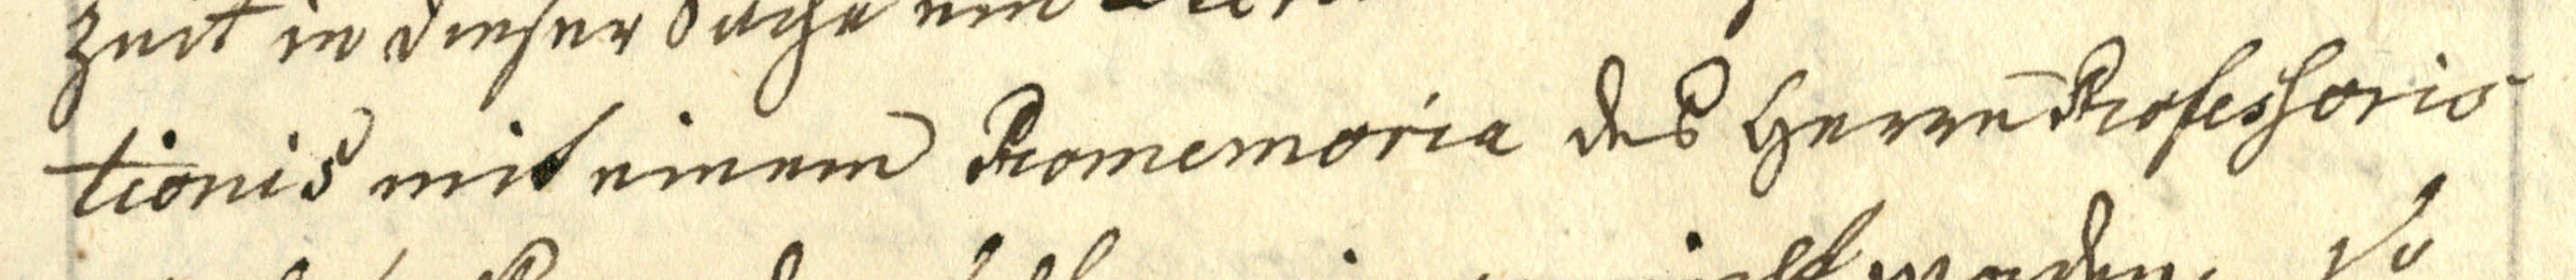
tionis mit einem Promemoria des Herrn Professoris
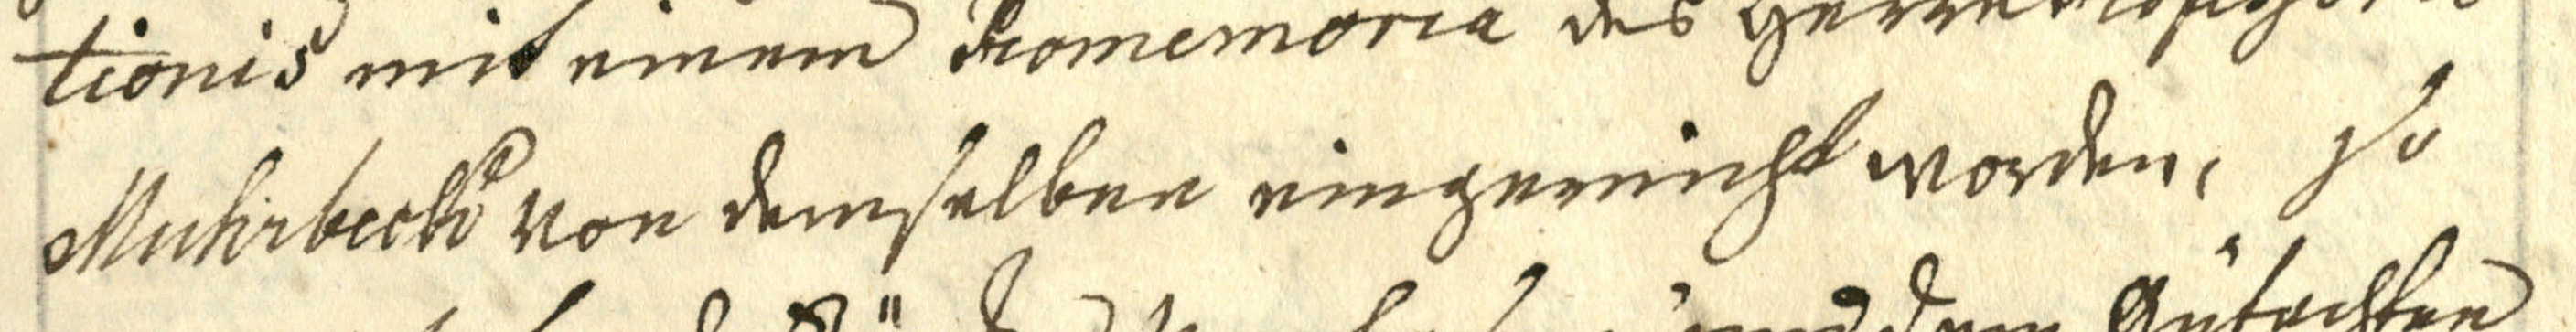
Muhrbeck von demselben eingereicht worden, so
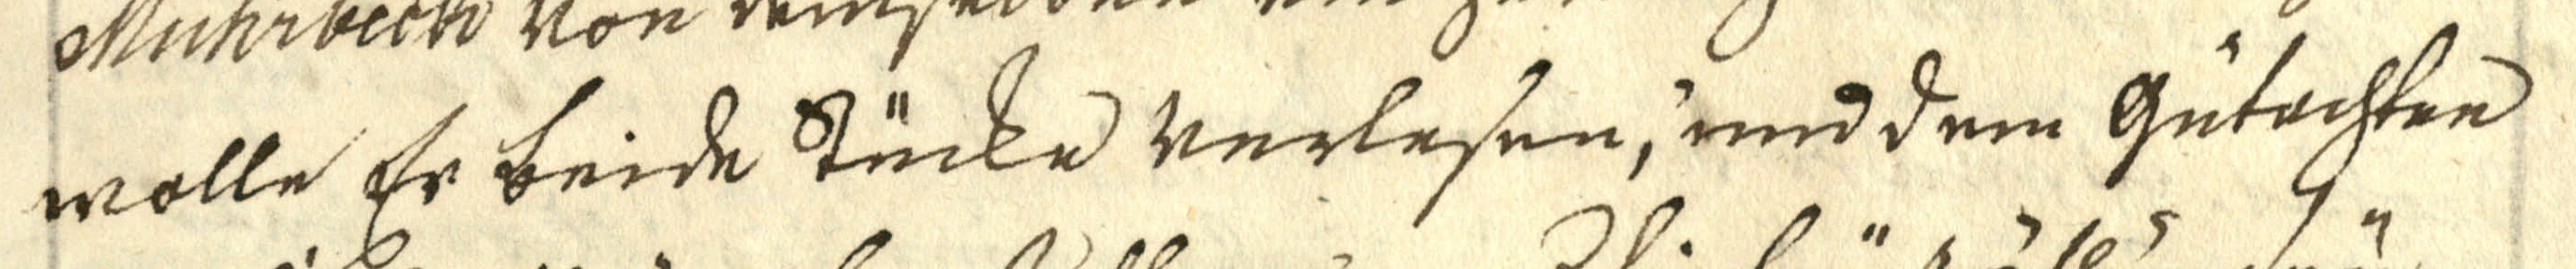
wolle Er beide Stücke verlesen, und dem Gutachten
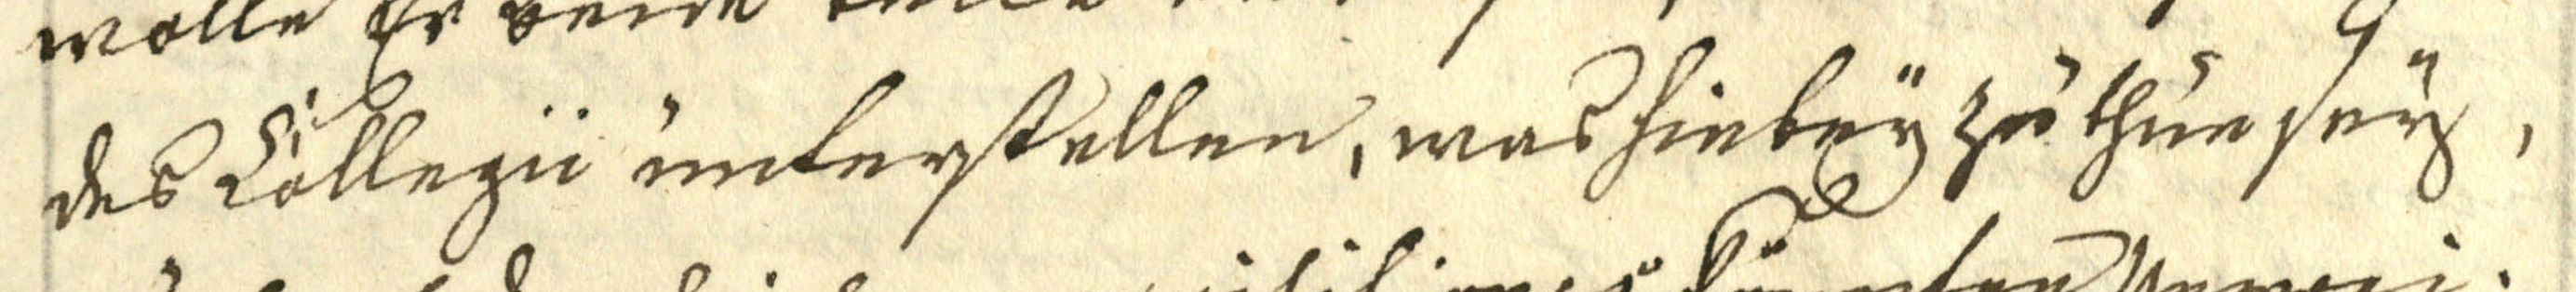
des Collegii unterstellen, was hiebeÿ zu thun seÿ,
